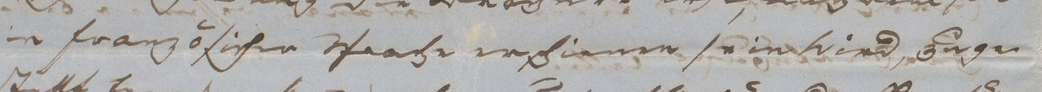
in französischer Sprache erschienen sein wird, zuge-
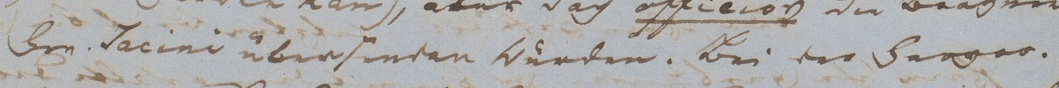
Hrn. Jacini übersenden würden. Bei der hervor-
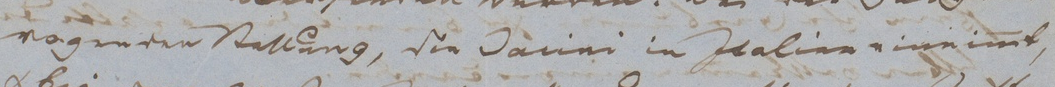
ragenden Stellung, die Jacini in Italien einnimmt,
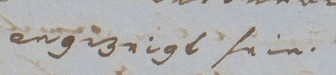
angezeigt sein.
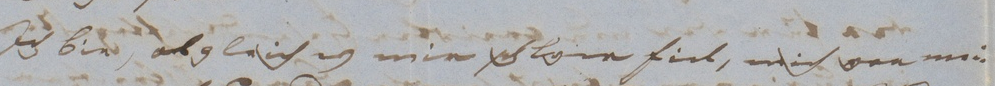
Ich bin, obgleich es mir schwer fiel, mich von mei-
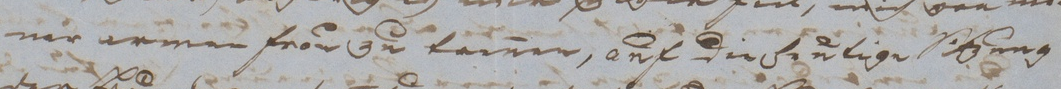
ner armen Frau zu trennen , auf die heutige Sitzung
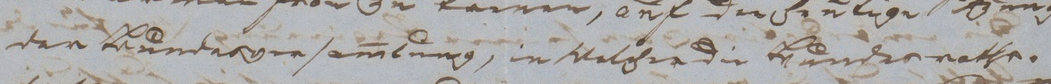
der Bundesversammlung, in welcher die Bundesraths-
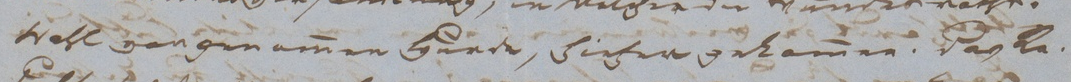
wahl vorgenommen wurde, hieher gekommen. Das Re-
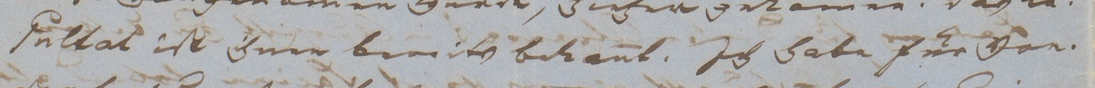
sultat ist ihnen bereits bekannt. Ich habe für Von-
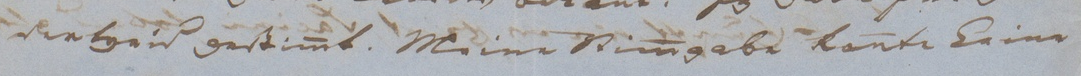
derweid gestimmt. Meine Stimmgabe konnte keine
